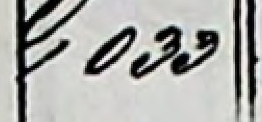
0,033
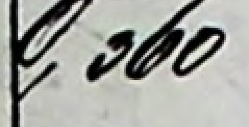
0,360
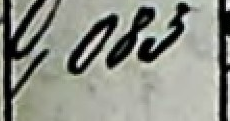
0,085
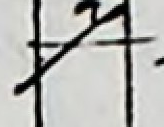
7
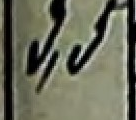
3,5
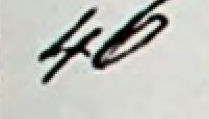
46
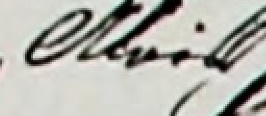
Alois
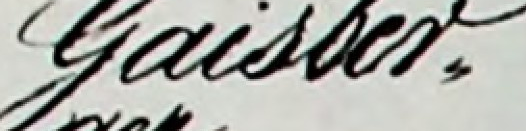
Gaisbger„
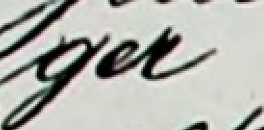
ger
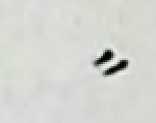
„
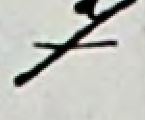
7
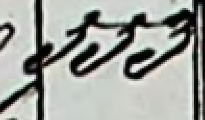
533
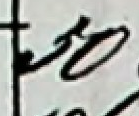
50
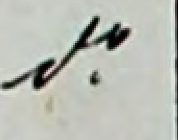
do
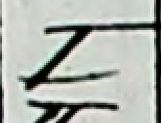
I
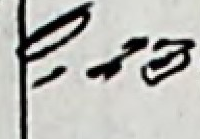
0,23
